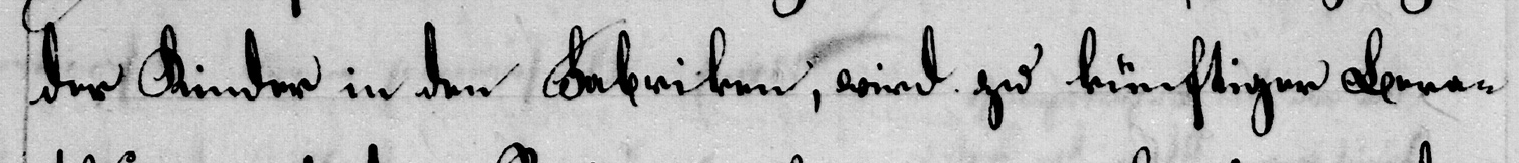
der Kinder in den Fabriken, wird zu künftiger Bera¬
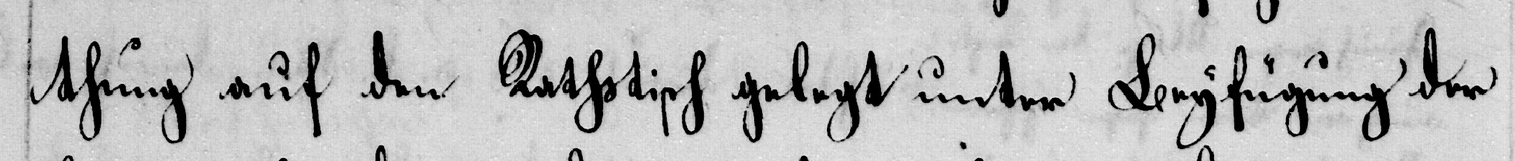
thung auf den Rathstisch gelegt unter Beyfügung der
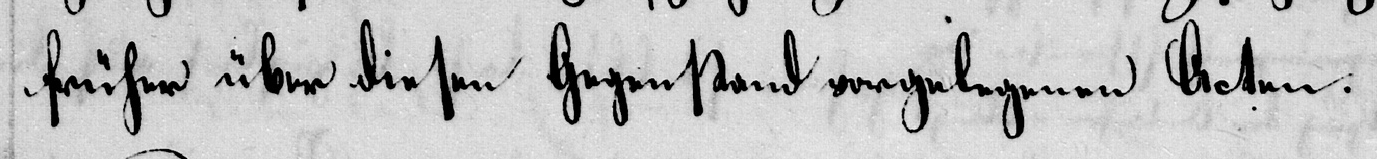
früher über diesen Gegenstand vorgelegenen Acten.
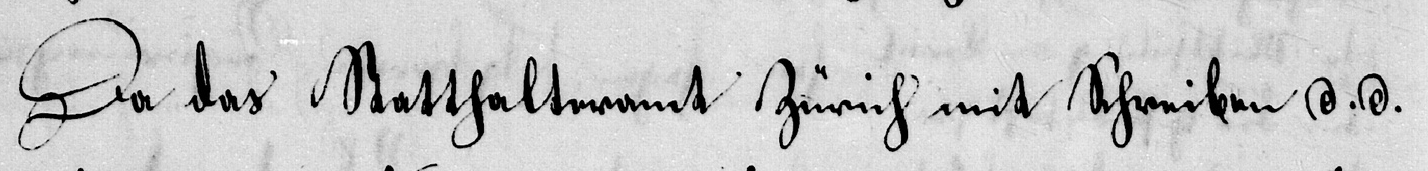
Da das Statthalteramt Zürich mit Schreiben d. d.
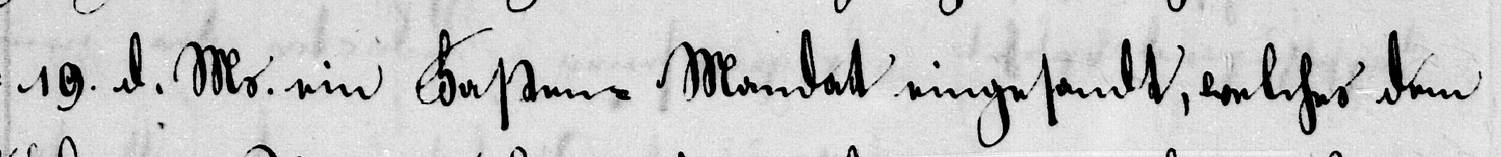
19. d. Ms. ein Fasten-Mandat eingesandt, welches dem
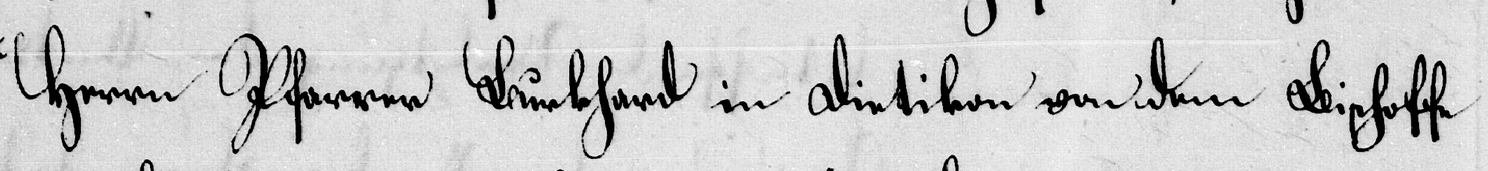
Herrn Pfarrer Burkhard in Dietikon von dem Bischoffe
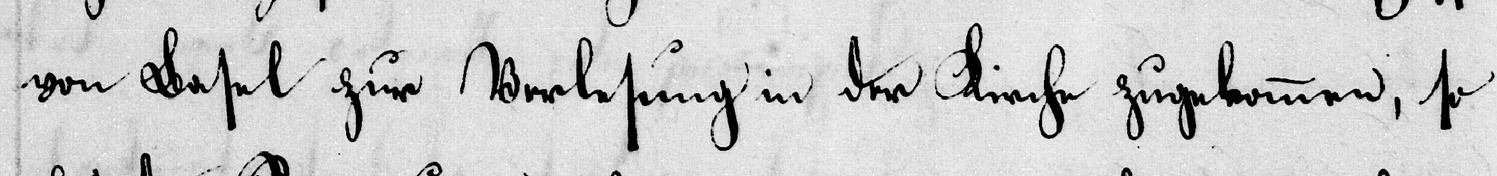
von Basel zur Verlesung in der Kirche zugekommen, so
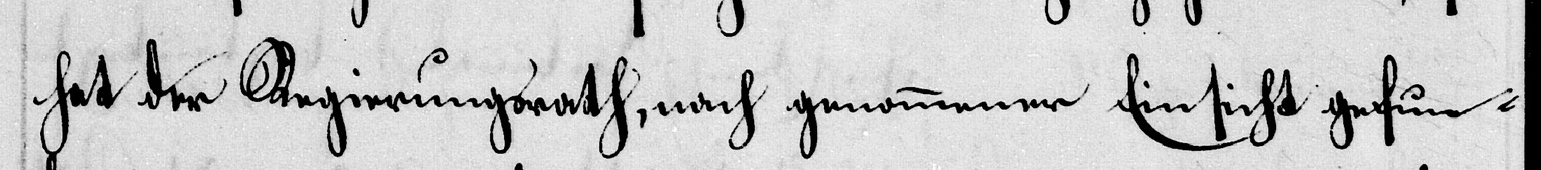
hat der Regierungsrath, nach genommener Einsicht gefun¬
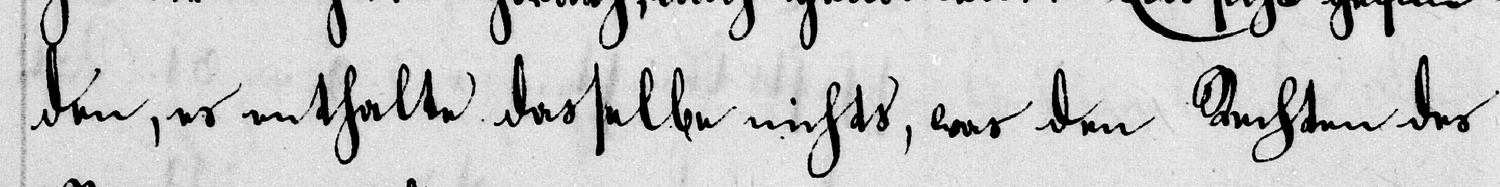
den, es enthalte dasselbe nichts, was den Rechten des
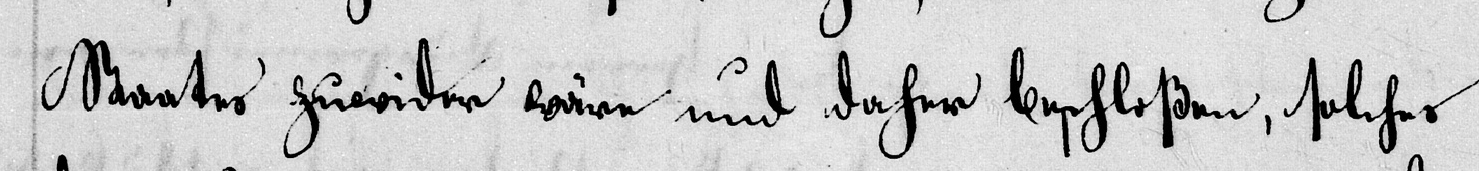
Staates zuwider wäre und daher beschloßen, solches
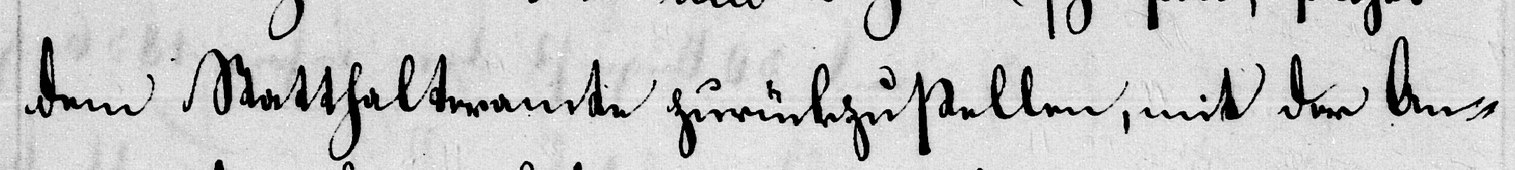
dem Statthalteramte zurückzustellen, mit der An¬
